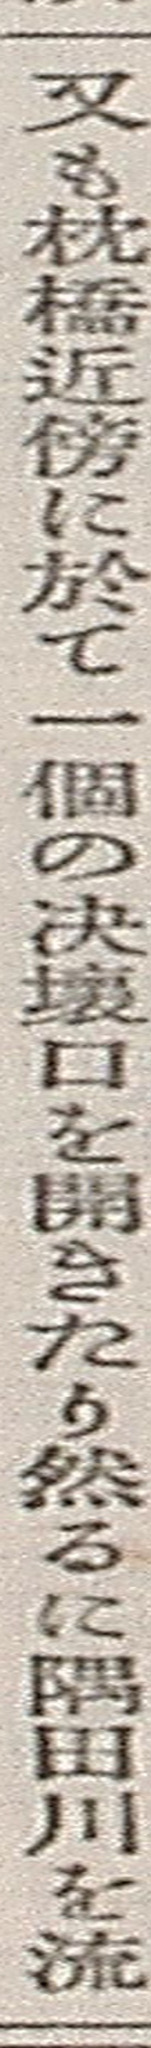又も枕橋近傍に於て一個の決壊口を開きたり然るに隅田川を流
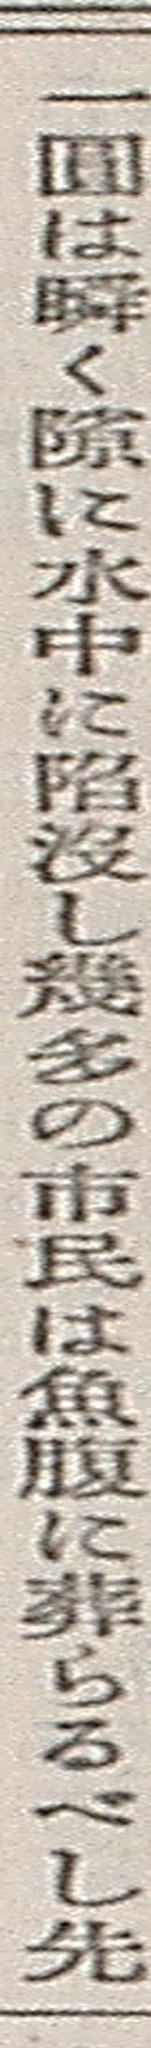一円は瞬く隙に水中に陥没し幾多の市民は魚腹に葬らるべし先
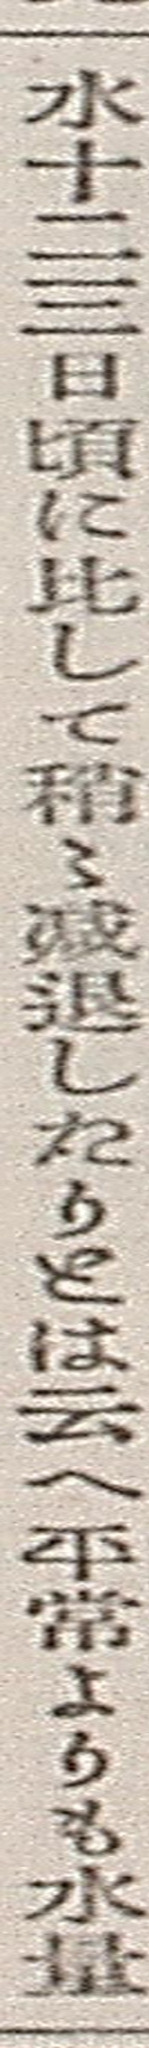水十二三日頃に比して稍々減退したりとは云へ平常よりも水量
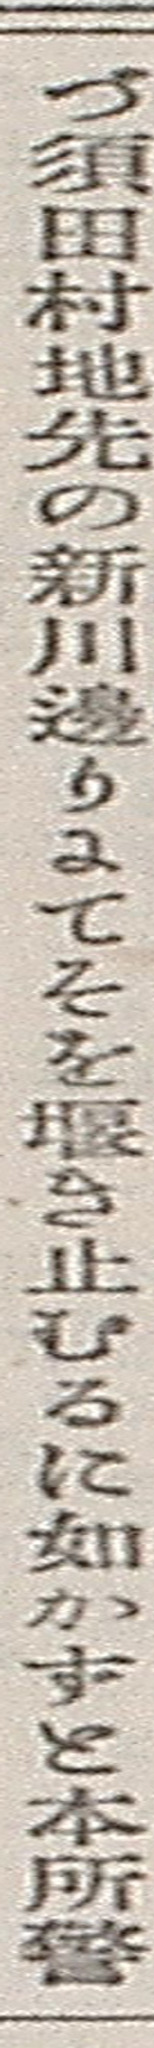づ須田村地先の新川辺りにてそを堰き止むるに如かずと本所警
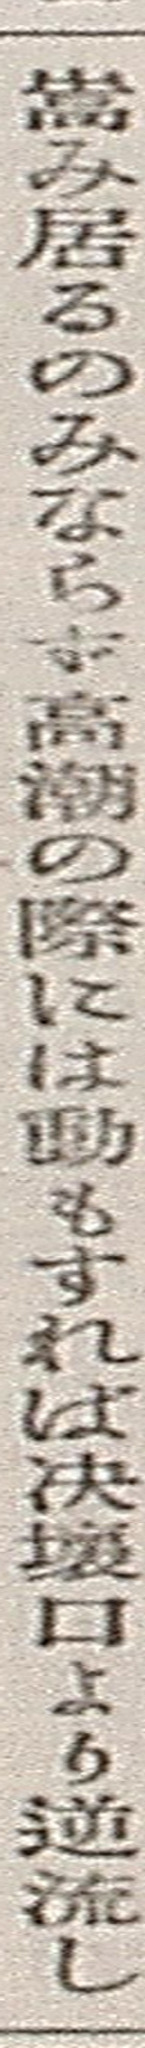嵩み居るのみならず高潮の際には動もすれば決壊口より逆流し
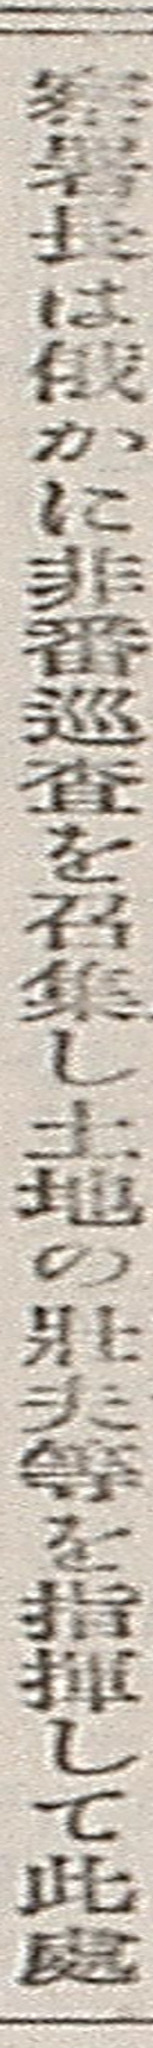察署長は俄かに非番巡査を召集し土地の壮夫等を指揮して此処
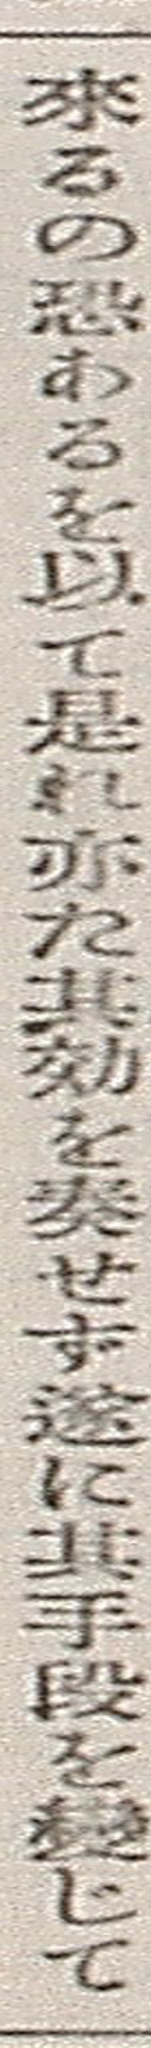来るの恐あるを以て是れ亦た其効を奏せず遂に其手段を変じて
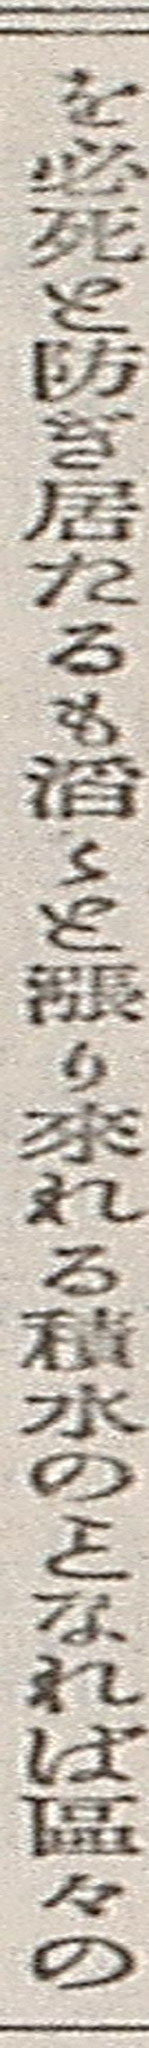を必死と防ぎ居たるも滔々と漲り来れる積水のことなれば区々の
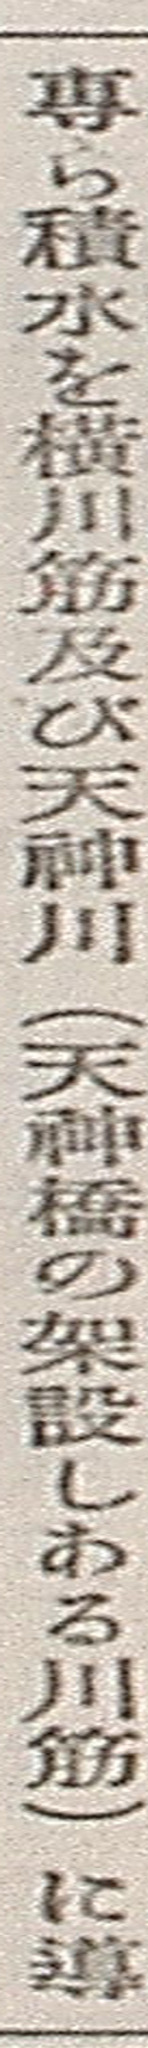専ら積水を横川筋及び天神川しある川筋）に導
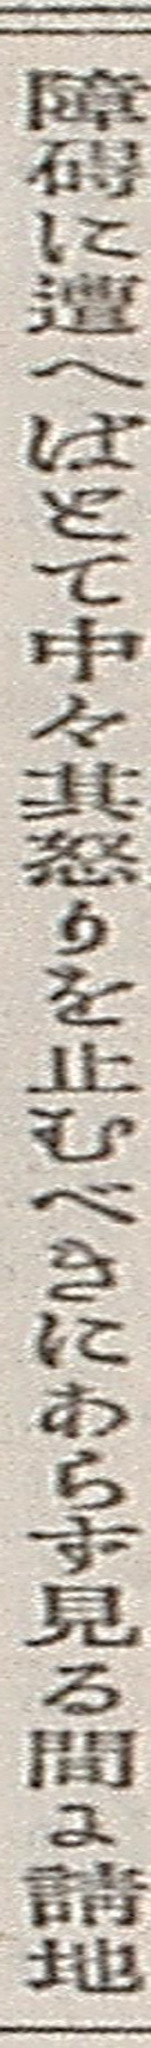障碍に遭へばとて中々其怒りを止むべきにあらず見る間に請地
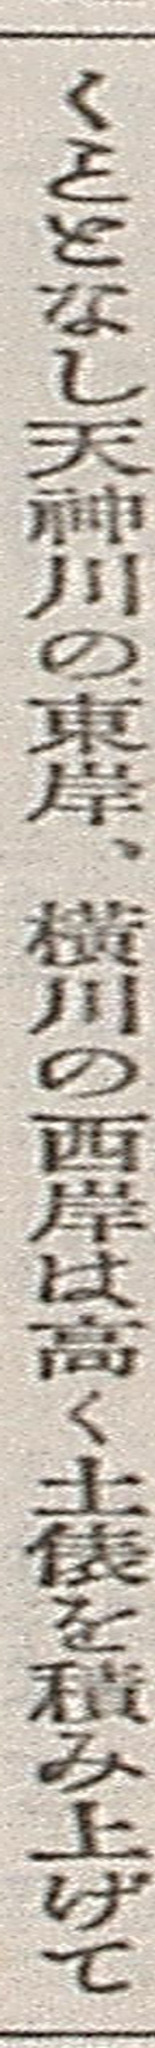くこととなし天神川の東岸、横川の西岸は高く土俵を積み上げて
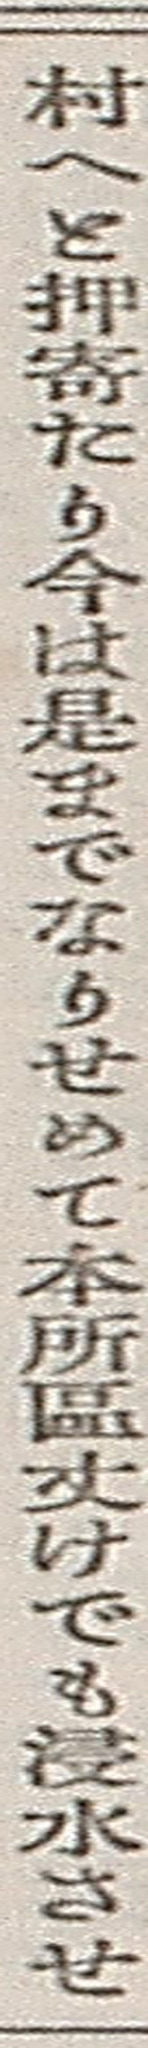村へと押寄たり今は是までなりせめて本所区丈けでも浸水させ
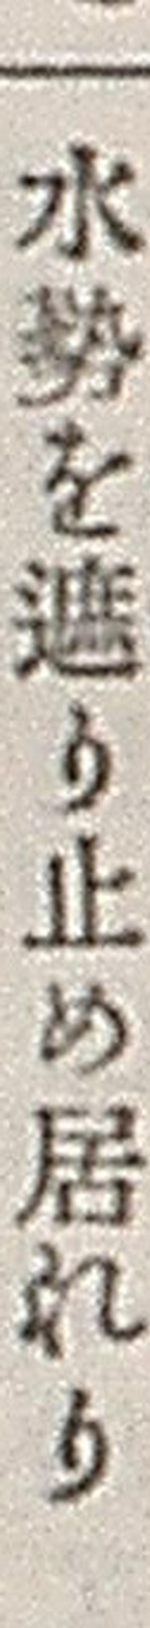水勢を遮り止め居れり
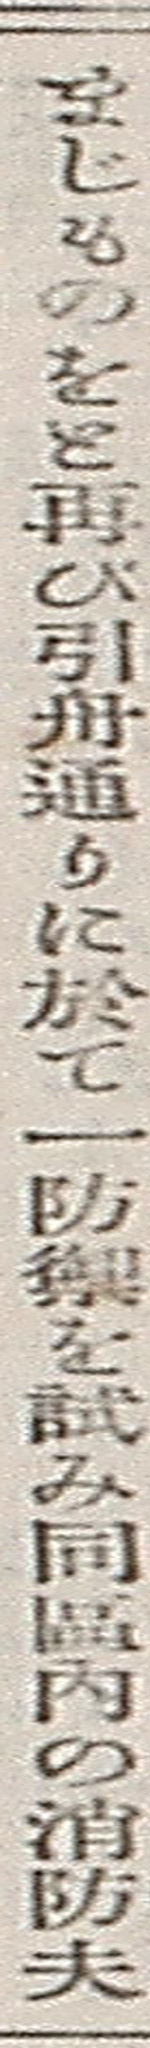まじものをと再び引舟通りに於て一防禦を試み同区内の消防夫
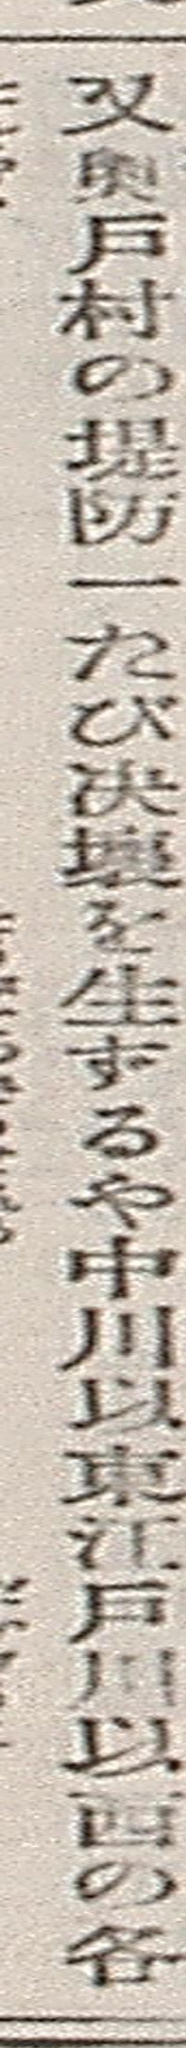又奥戸村の堤防一たび決壊を生ずるや中川以東江戸川以西の各
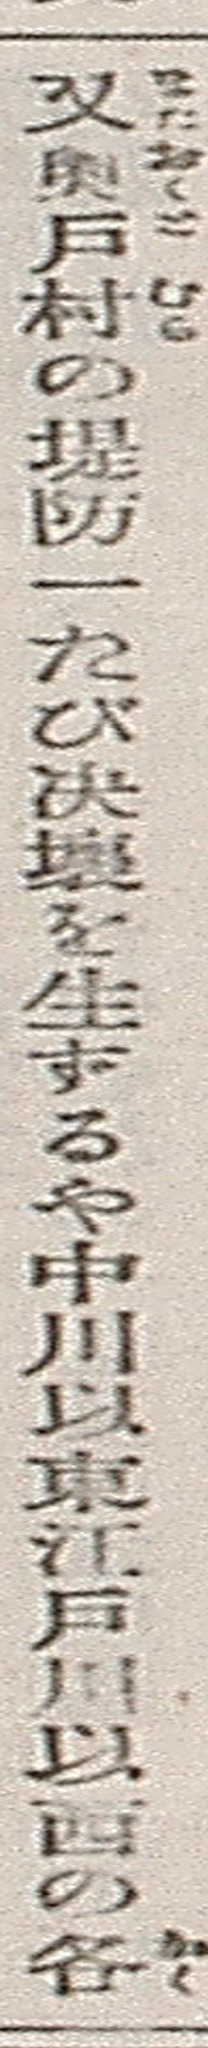又奥戸村の堤防一たび決壊を生ずるや中川以東江戸川以西の各
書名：風俗畫報臨時増刊第百二十四號　洪水地震被害録（上）
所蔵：東京大学地震研究所図書室 Earthquake Research Institute Library, The University of Tokyo, JAPAN
